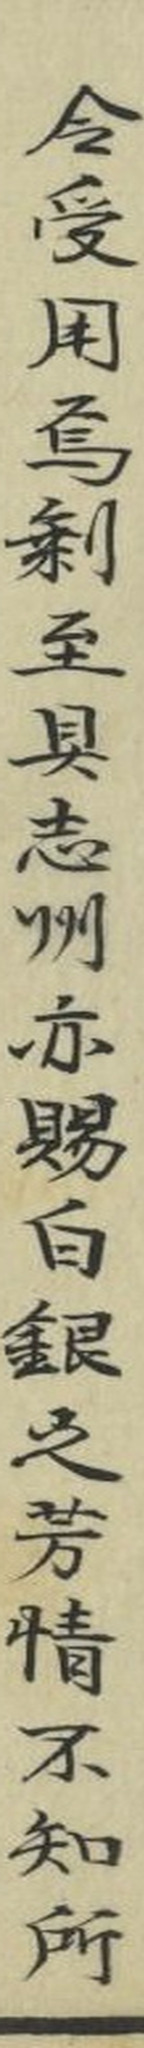令受用焉剰至具志州亦賜白銀之芳情不知所
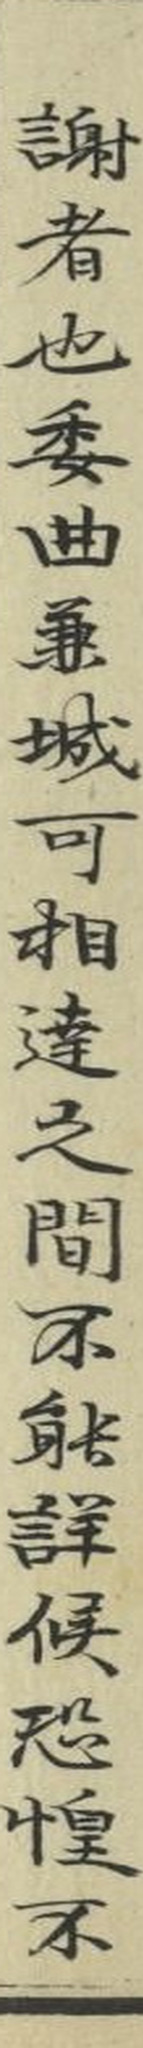謝者也委曲兼城可相達之間不能詳候恐惶不
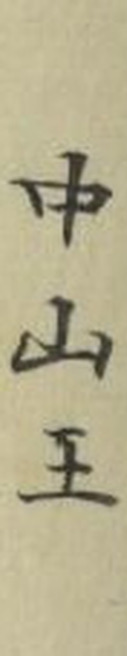中山王
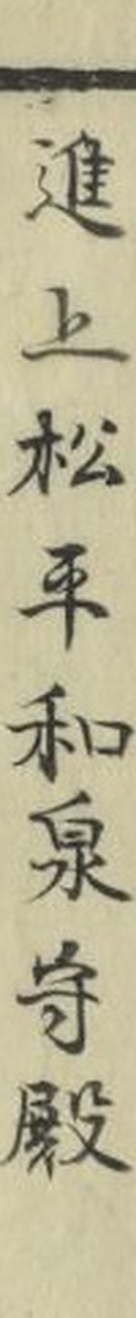進上松平和泉守殿
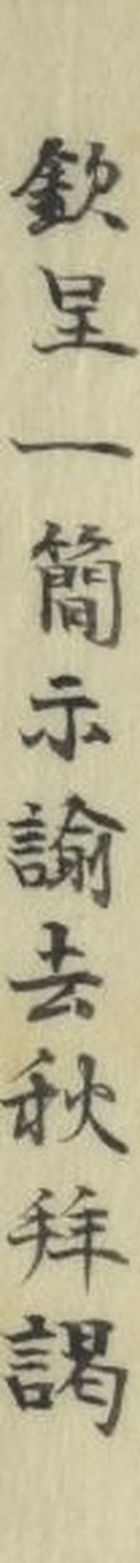欽呈一簡示諭去秋拝謁
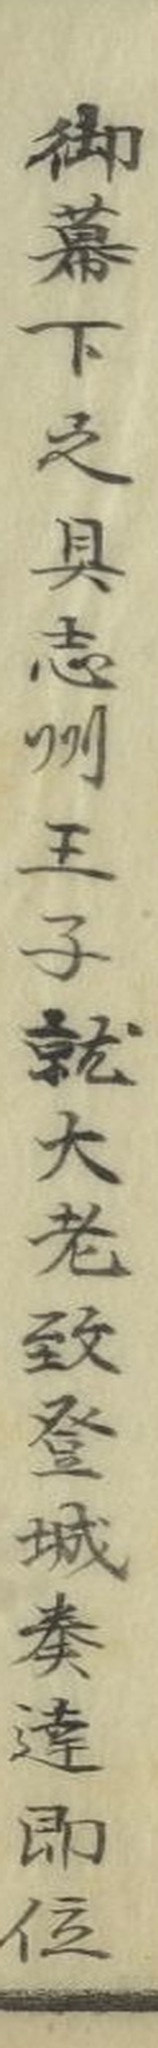御幕下之具志州王子就大老致登城奏達即位
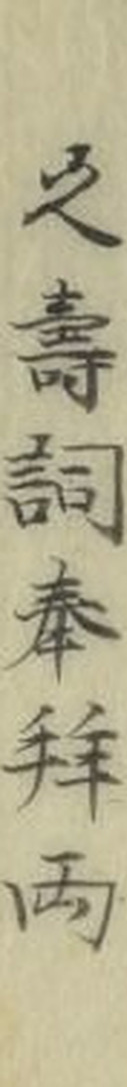之寿詞奉拝両
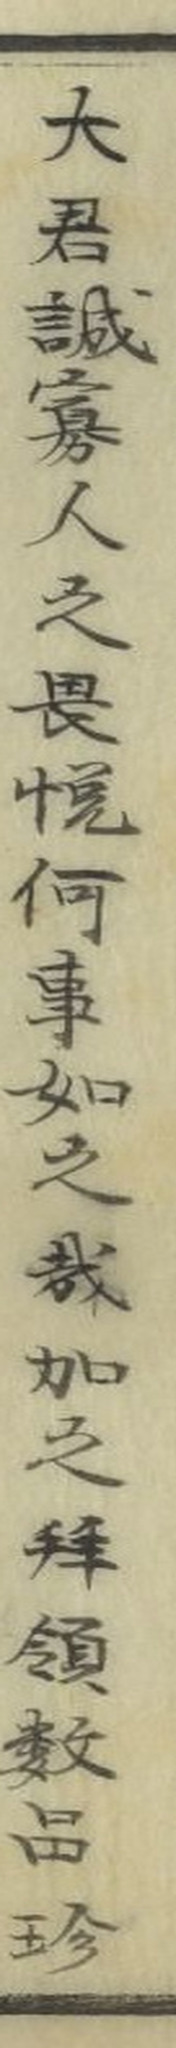大君誠寡人之畏悦何事如之哉加之拝領数品珍
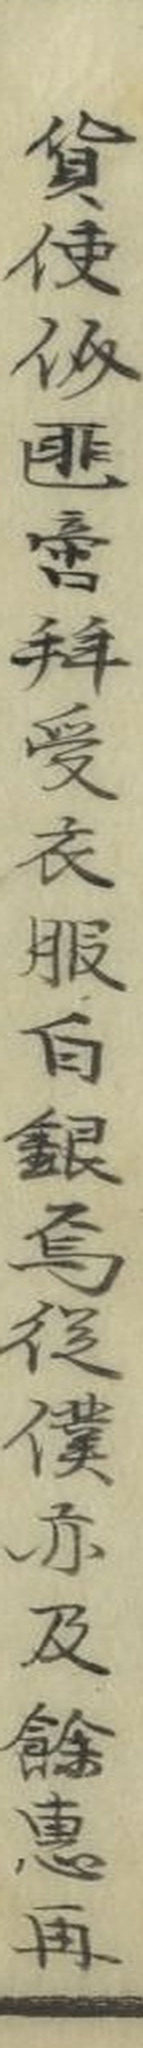貨使价匪啻拝受衣服白銀焉従僕亦及余惠再
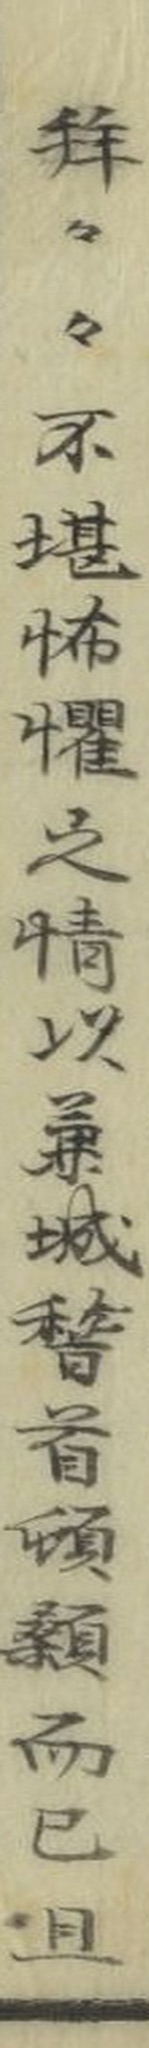拝々々不堪怖懼之情以兼城稽首頓顙而巳且

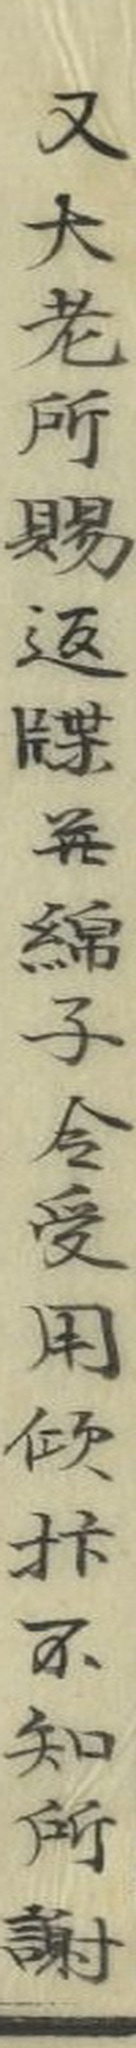又大老所賜返牒幷綿子令受用傾抃不知所謝
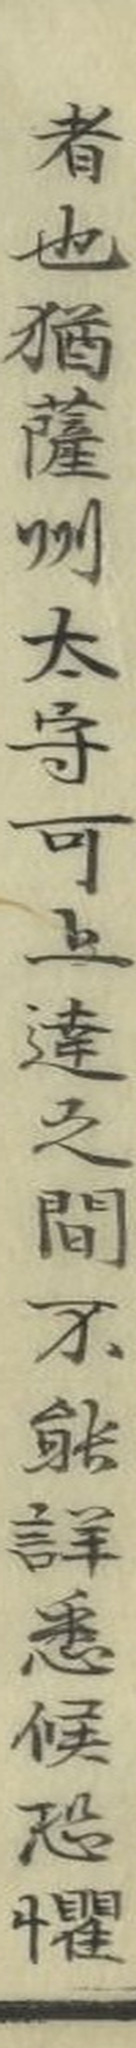者也猶薩州太守可上達之間不能詳悉候恐懼
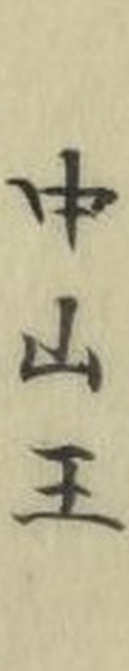中山王
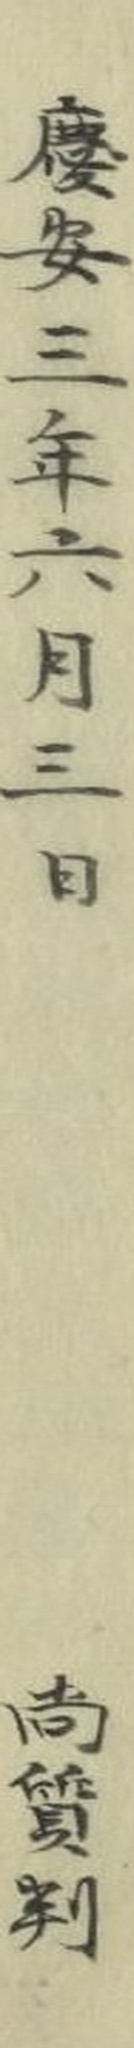慶安三年六月三日尚質判
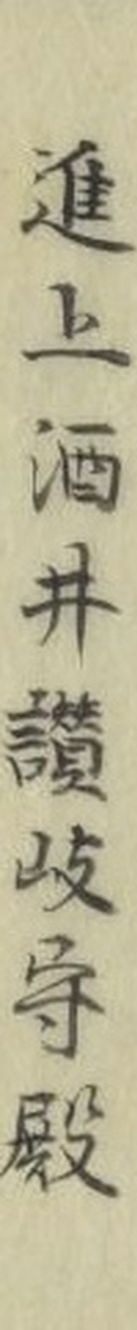進上酒井讃岐守殿
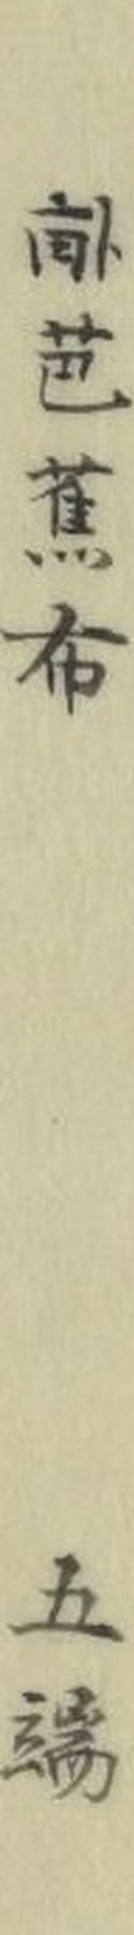畝芭蕉布五端
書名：琉球往来（上）
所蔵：University of the Ryukyus Library
